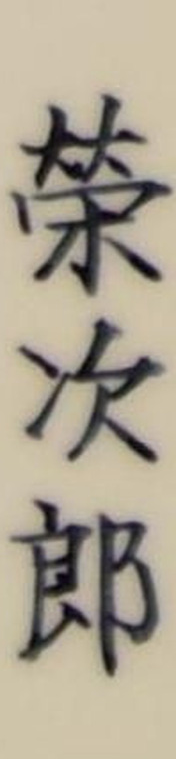榮次郎
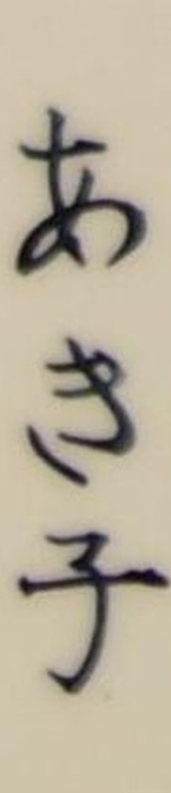あき子
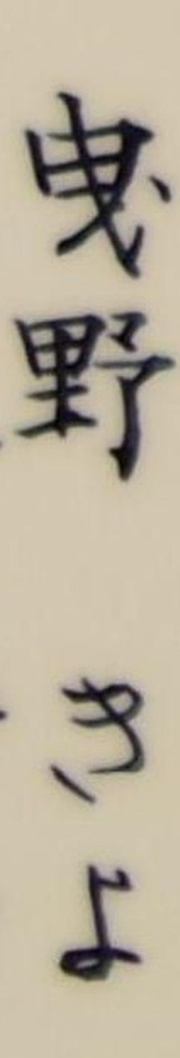曳野きよ
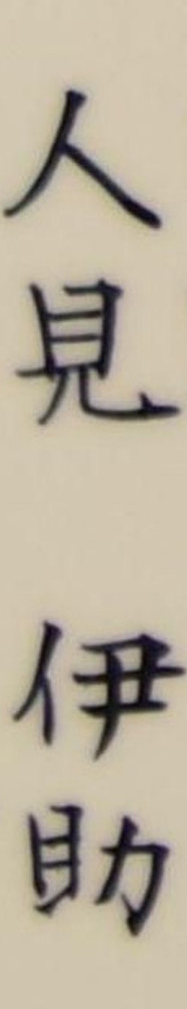人見伊助
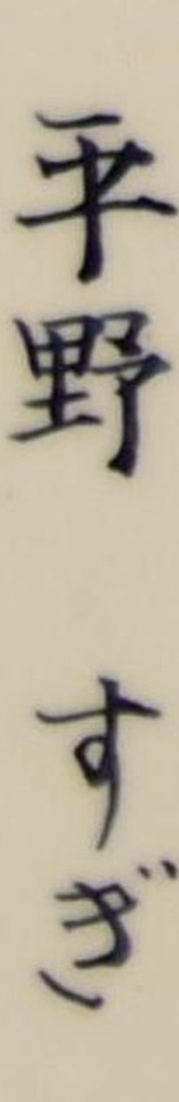平野すぎ
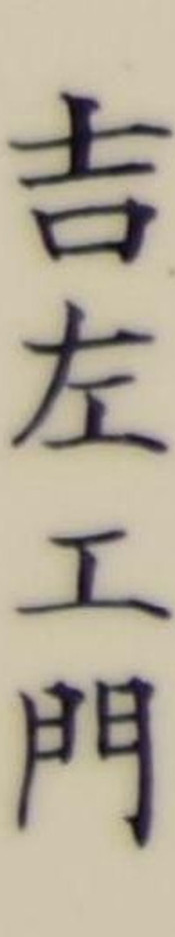吉左衛門

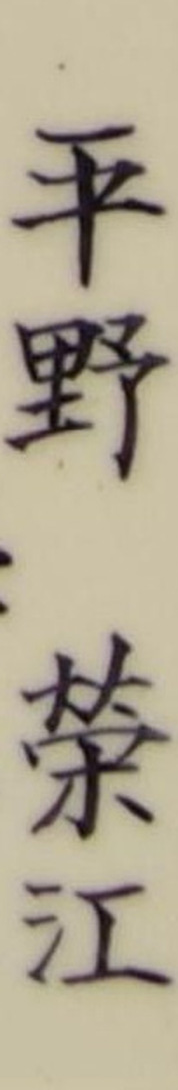平野榮江
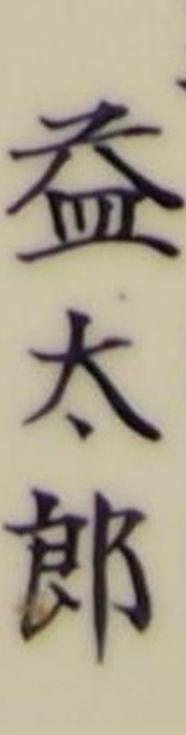益太郎
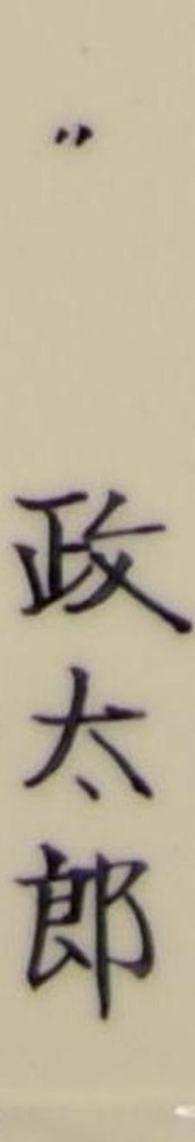政太郎
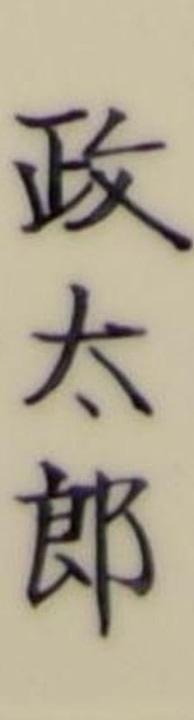政太郎
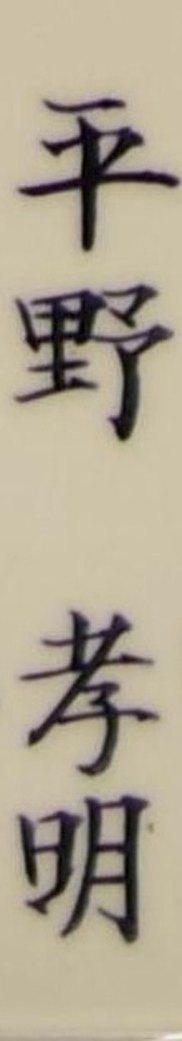平野孝明
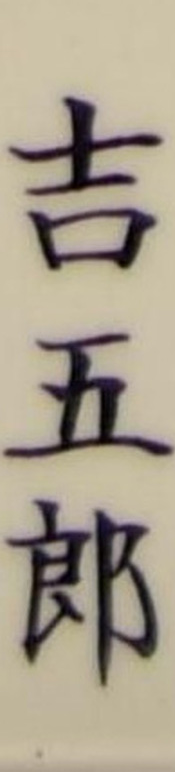吉五郎
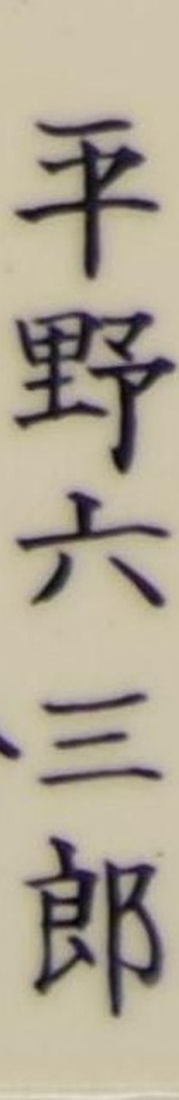平野六三郎
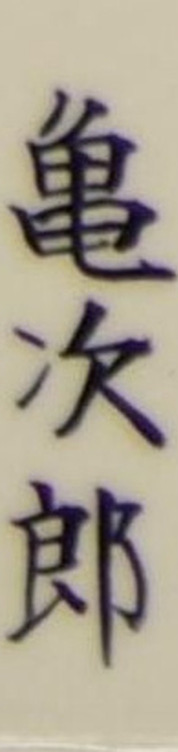亀次郎

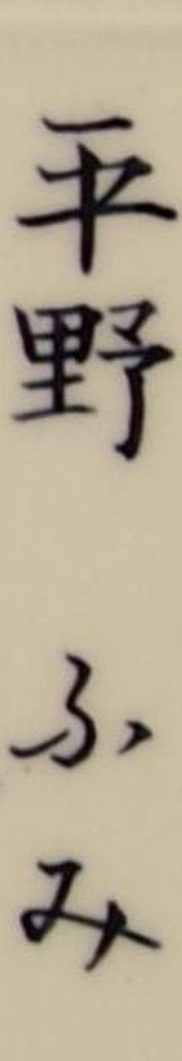平野ふみ
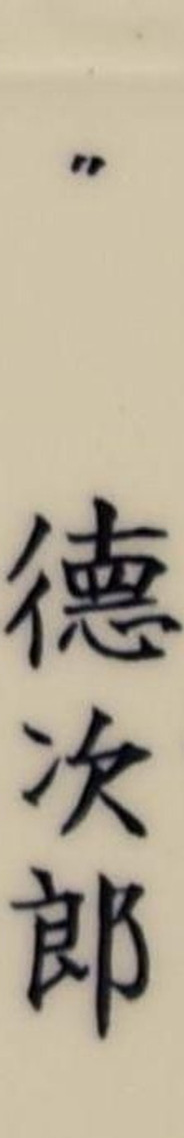徳次郎
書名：A~D
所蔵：koyasan kongobuji
